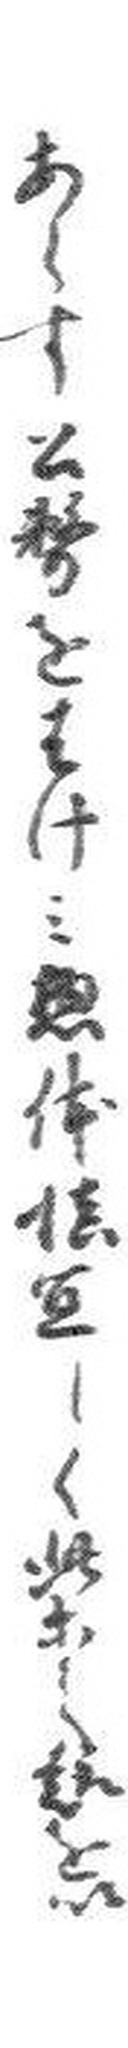あらす公務をはけミ惣体慎宜しく此等之趣を以
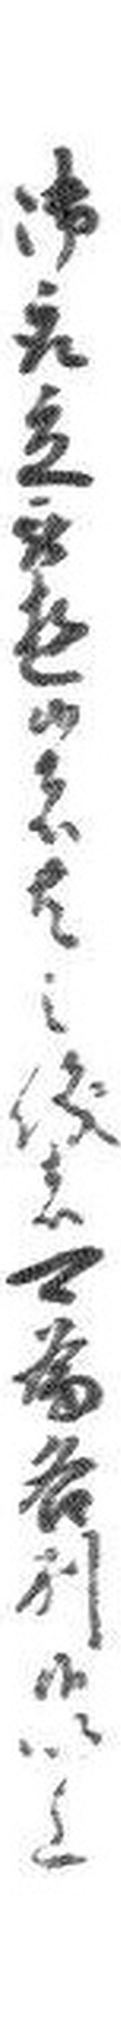御取立被遊候者共之儀者可為格別候以上

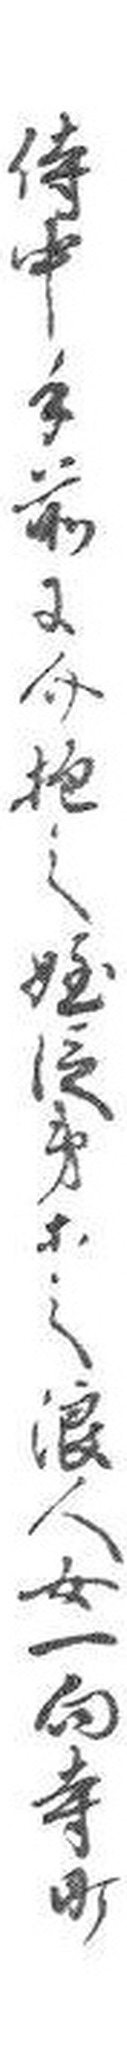侍中手前に介抱之姪従弟等之浪人女一向寺町
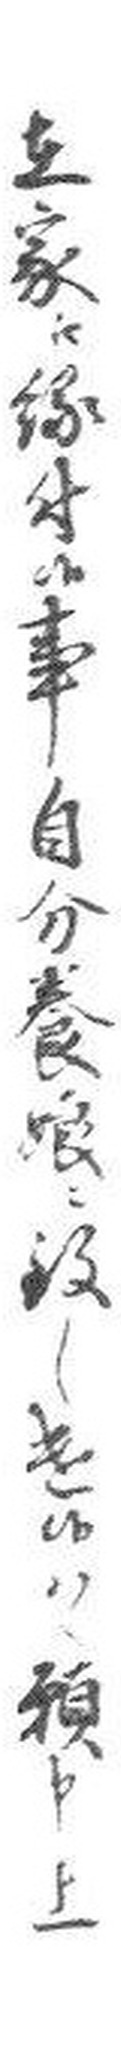在家江縁付候事自分養娘ニ致し遣候ハヽ願申上
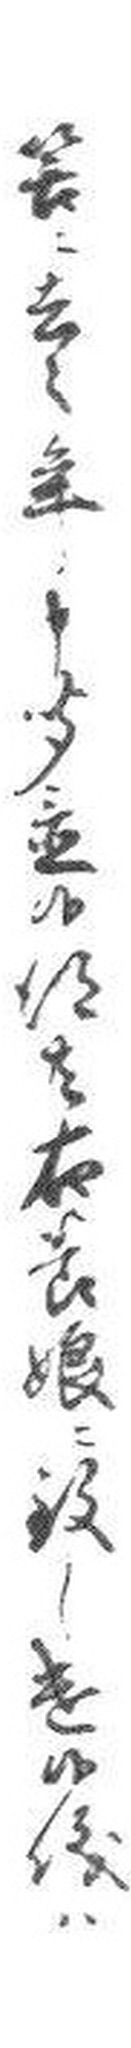筈ニ去々年申聞置候得共右養娘ニ致し遣候儀ハ
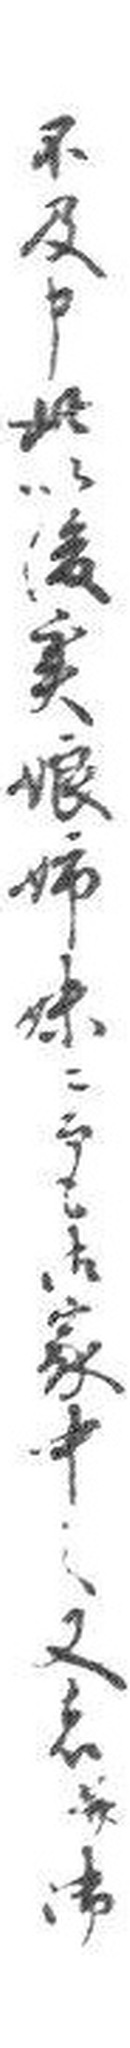不及申此以後実娘姉妹ニ而も御家中之又者并御
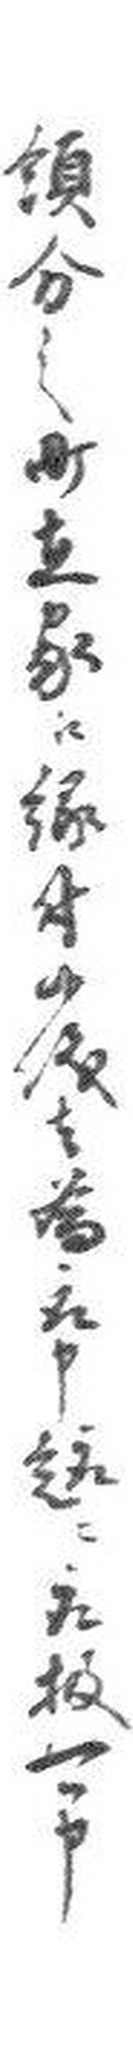領分之町在家江縁付候儀者為取申趣ニ取扱可申
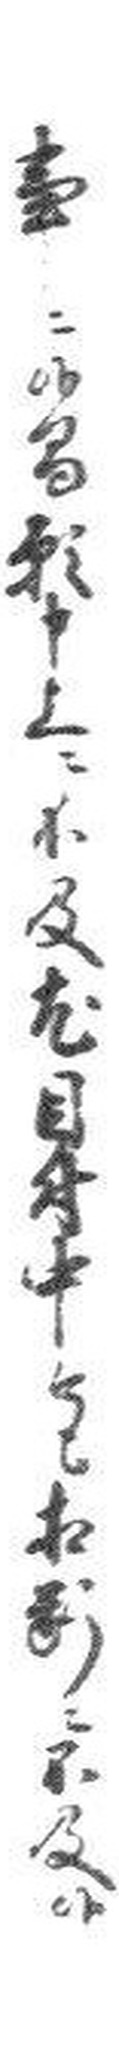事ニ候間願申上ニ不及尤目付中江も相断ニ不及候
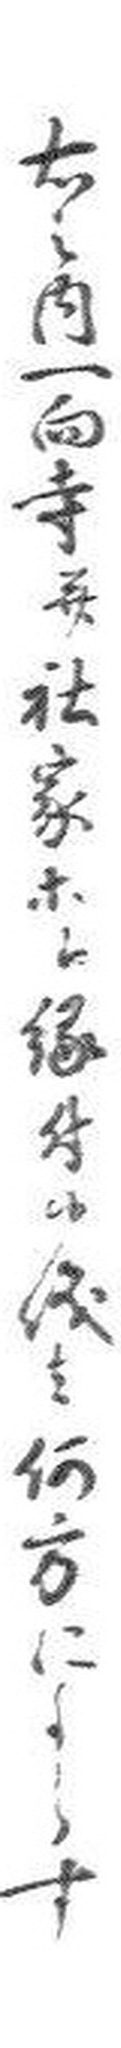右之内一向寺并社家等江縁付候儀者何方によらす
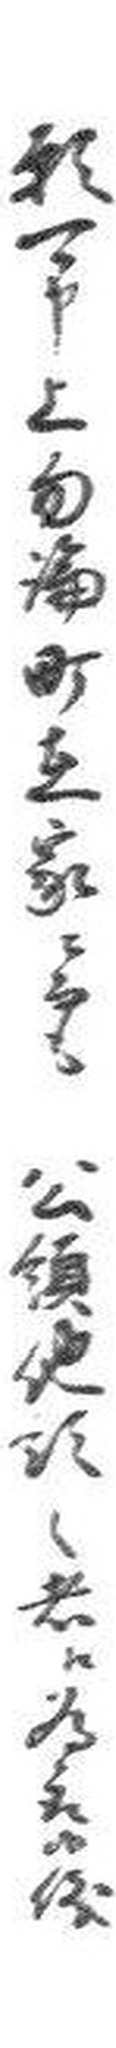願可申上勿論町在家ニ而も公領他領之者江為取候儀
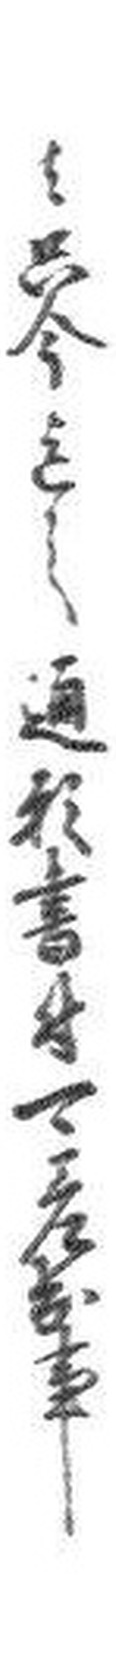者只今迄之通願書付可差出事
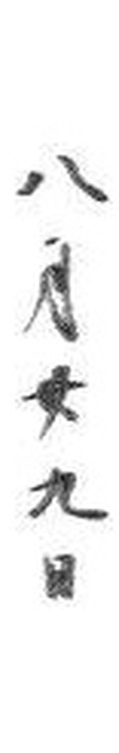八月廿九日
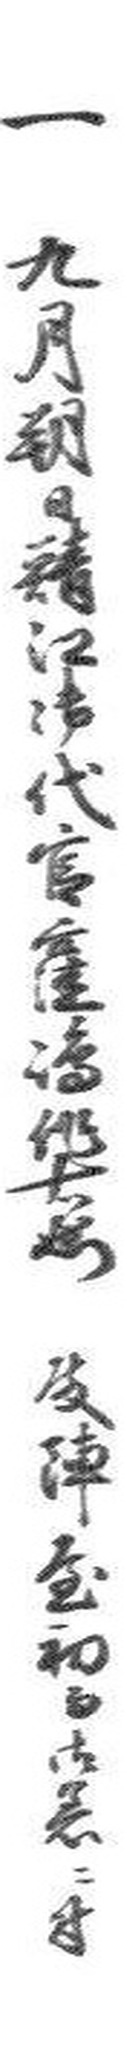一九月朔日鯖江御代官窪嶋作右衛門殿陣屋初而御着ニ付
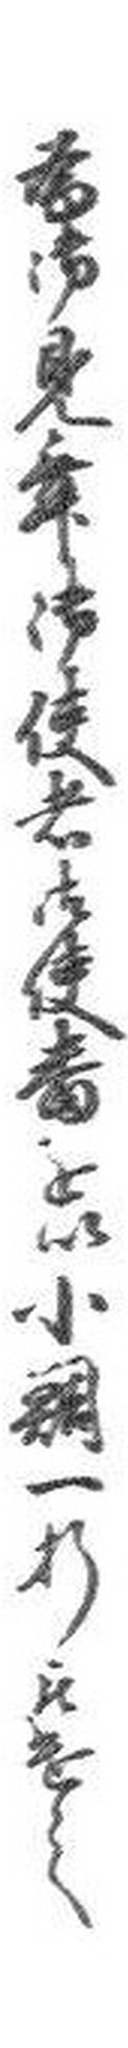為御見舞御使者御使番を以小鯛一折被遣之
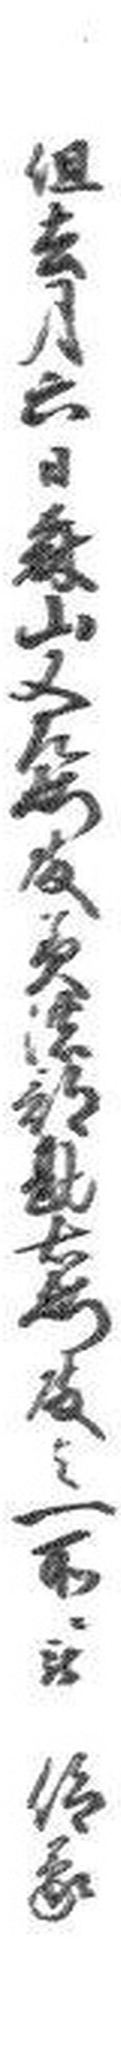但去月六日森山又左衛門殿美濃部勘右衛門殿与一所ニ被仰
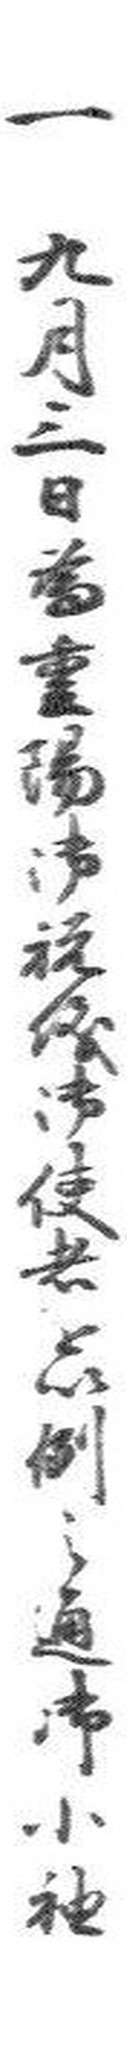一九月三日為重陽御祝儀御使者を以例之通御小袖
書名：家譜 二十九 吉邦公 従正徳二年到正徳三年
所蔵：福井県文書館 Fukui Prefectural Archives
